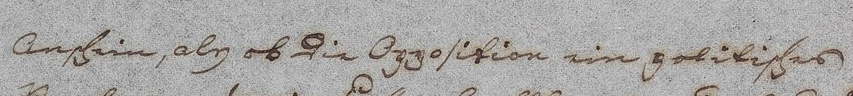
Anschein, als ob die Opposition ein politisches
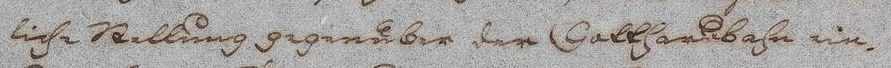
liche Stellung gegenüber der Gotthardbahn ein-
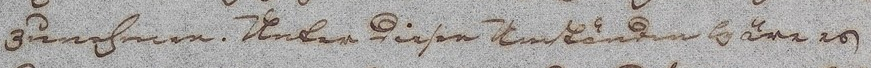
zunehmen. Unter diesen Umständen wäre es
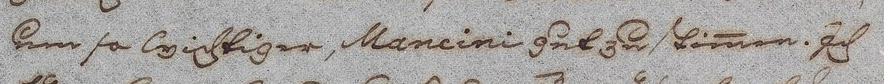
um so wichtiger, Mancini gut zu stimmen. Ich
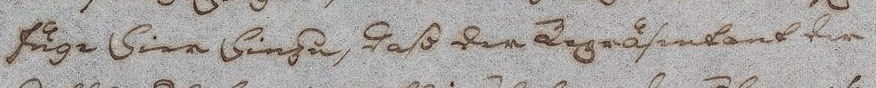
füge hier hinzu, daß der Repräsentant der
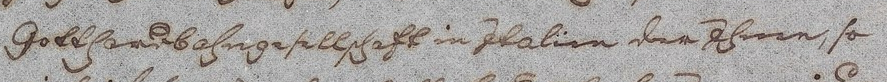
Gotthardbahngesellschaft in Italien der Ihnen, so
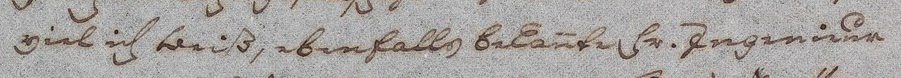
viel ich weiß, ebenfalls bekannte Hr. Ingenieur
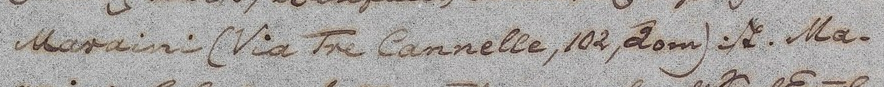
Maraini (Via Tre Cannelle, 102, Rom) ist. Ma-
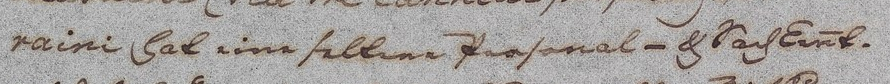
raini hat eine seltene Personal- & Sachkennt-
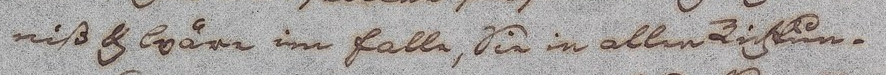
niß & wäre im Falle, Sie in allen Richtun-
